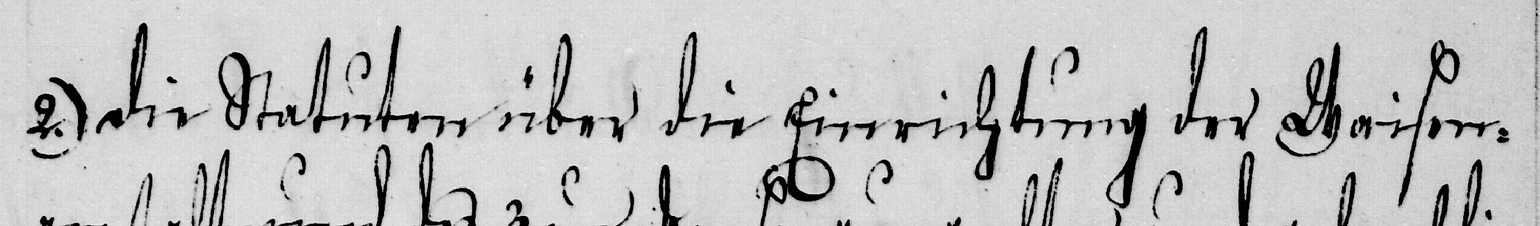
2.) die Statuten über die Einrichtung der Waisen¬
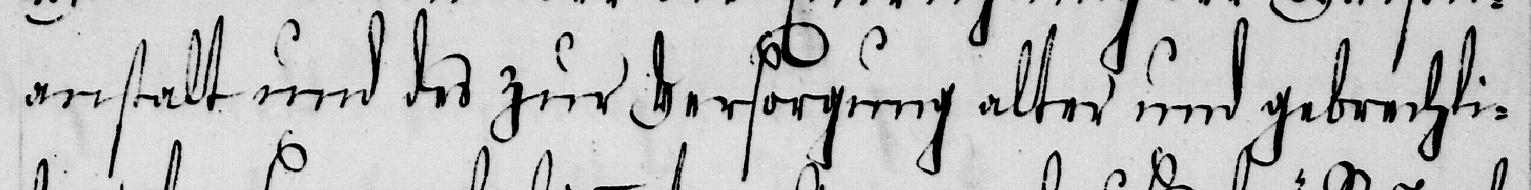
anstalt und des zur Versorgung alter und gebrechli¬
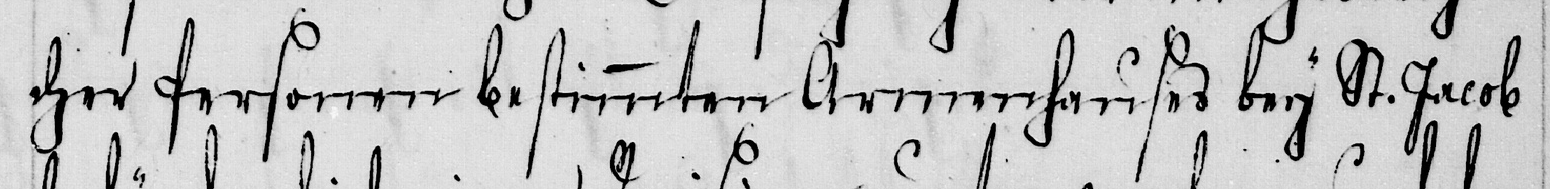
cher Personen bestimmten Armenhauses bey St. Jacob
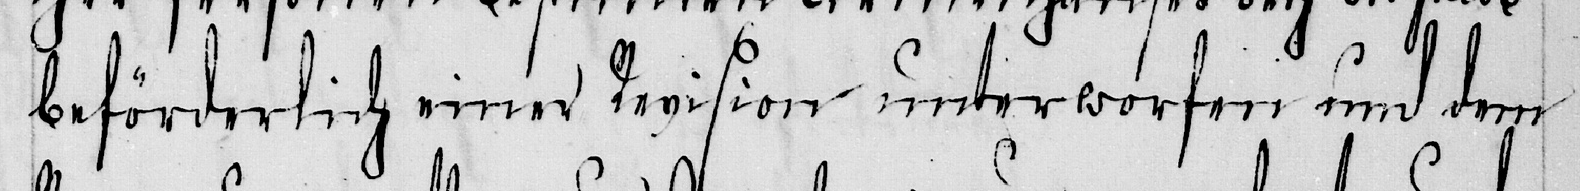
beförderlich einer Revision unterworfen und dem
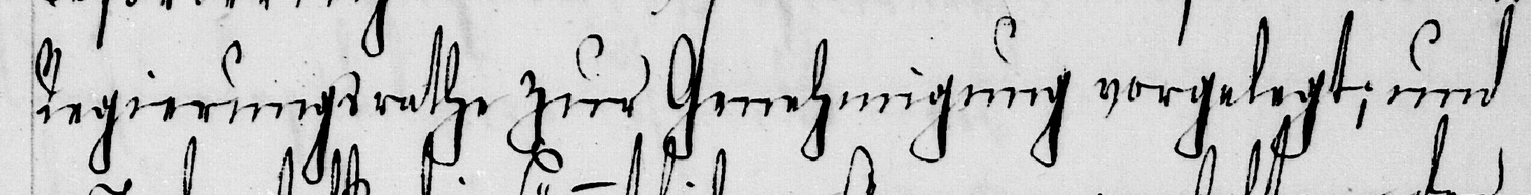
Regierungsrathe zur Genehmigung vorgelegt; und
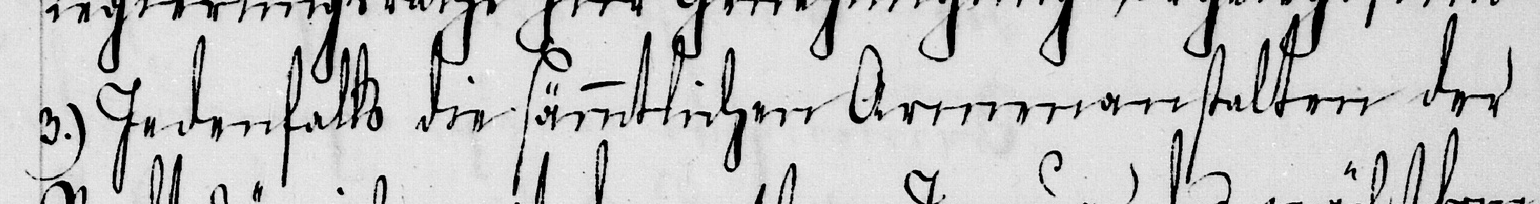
3.) Jedenfalls die sämmtlichen Armenanstalten der
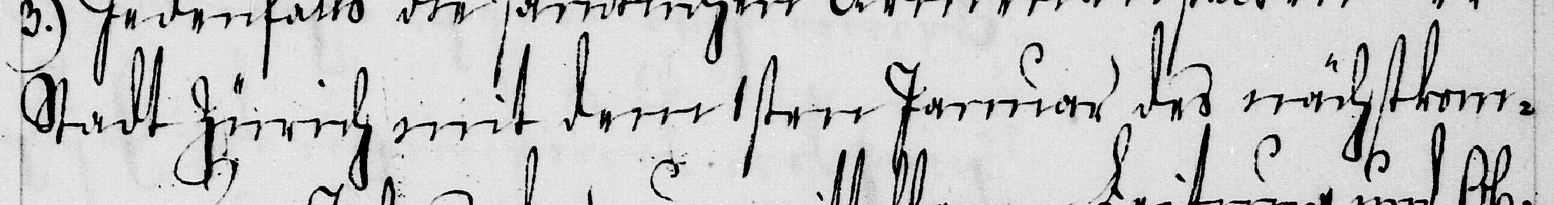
Stadt Zürich mit dem 1sten Januar des nächstkom¬
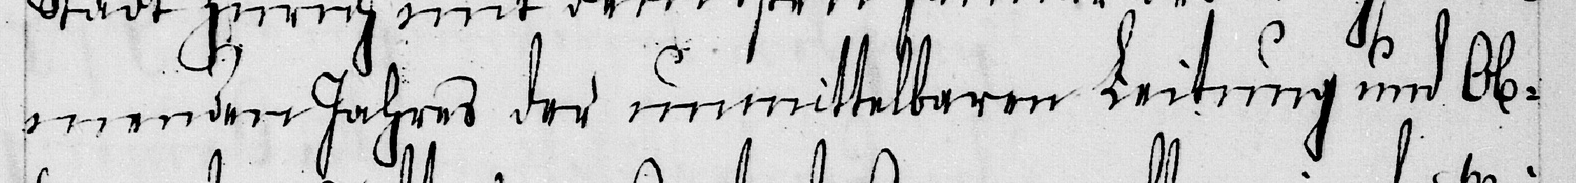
menden Jahres der unmittelbaren Leitung und Ob¬
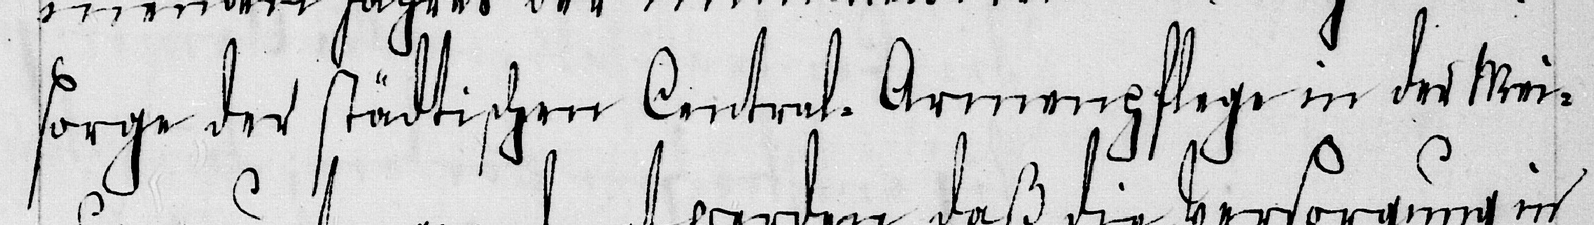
sorge der städtischen Central-Armenpflege in der Mei¬
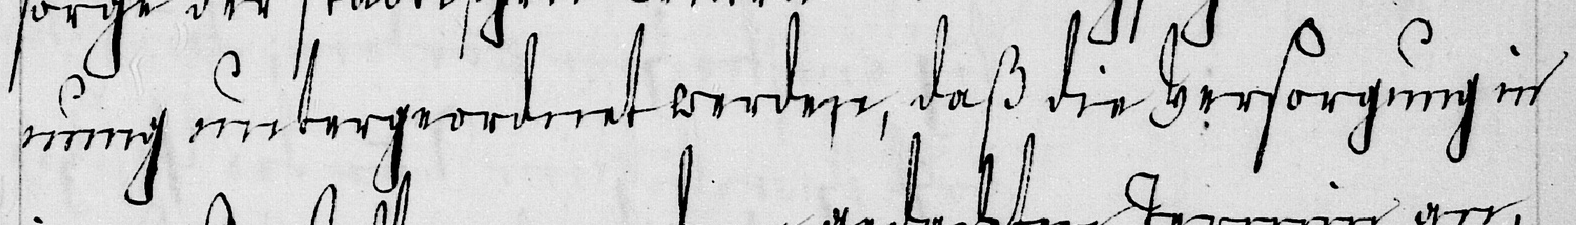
nung untergeordnet werden, daß die Versorgung in
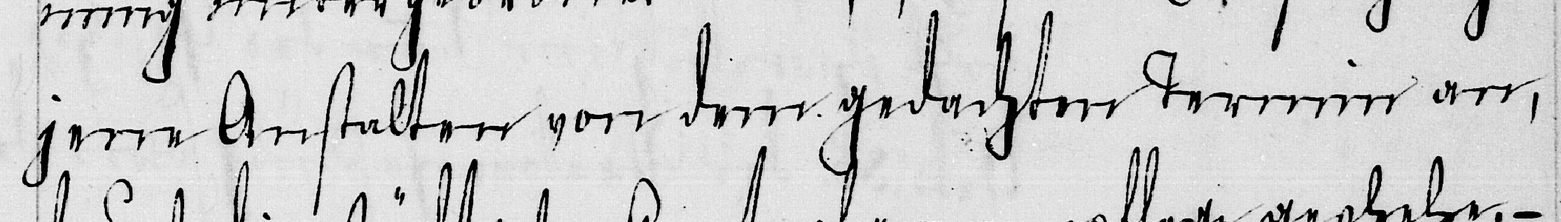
jene Anstalten von dem gedachten Termin an,
